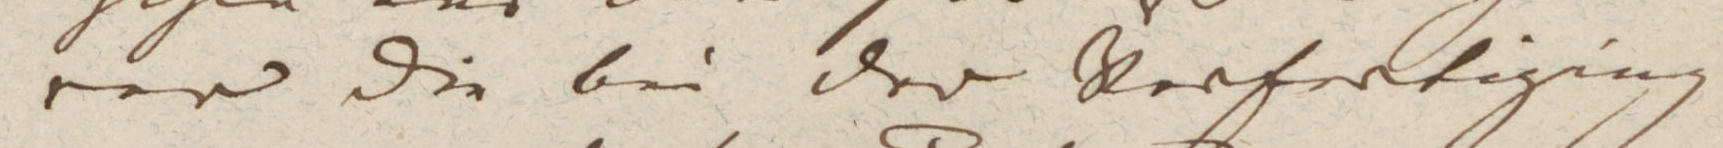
vor die bei der Verfertigung
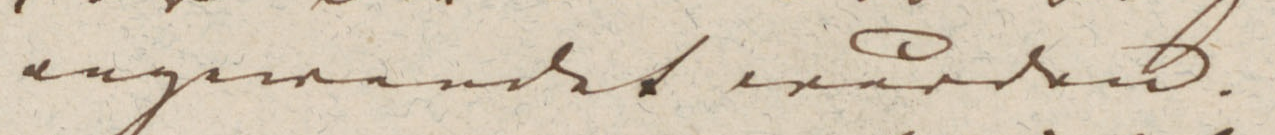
angewendet wurden.
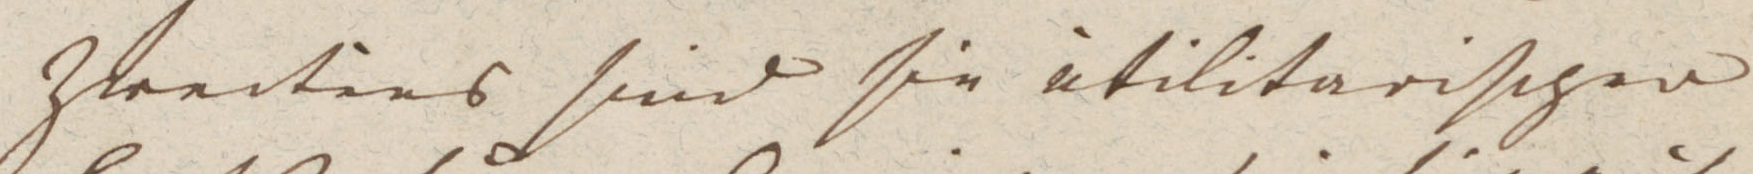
Zweitens sind sie utilitarischer
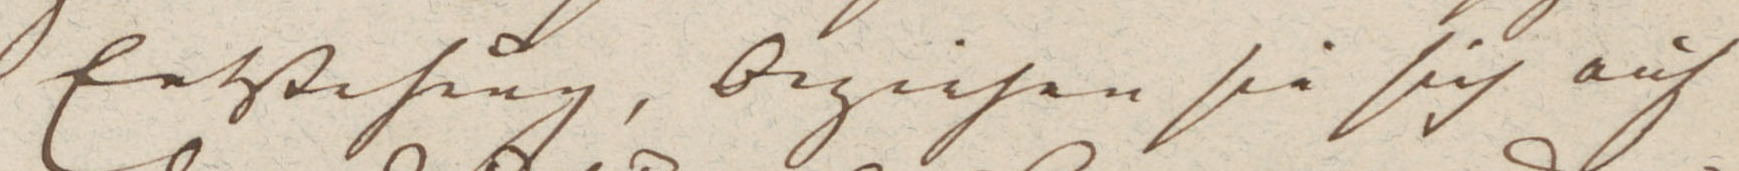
Entstehung, beziehen sie sich auf
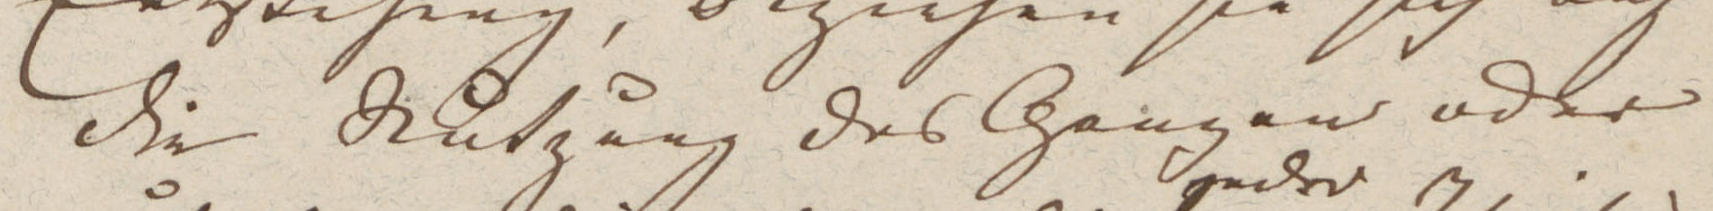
die Nutzung des Ganzen oder
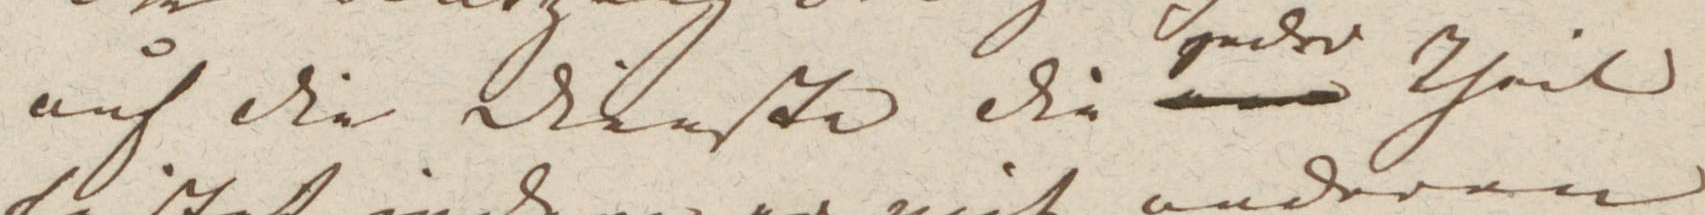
auf die Dienste die ein jeder Theil
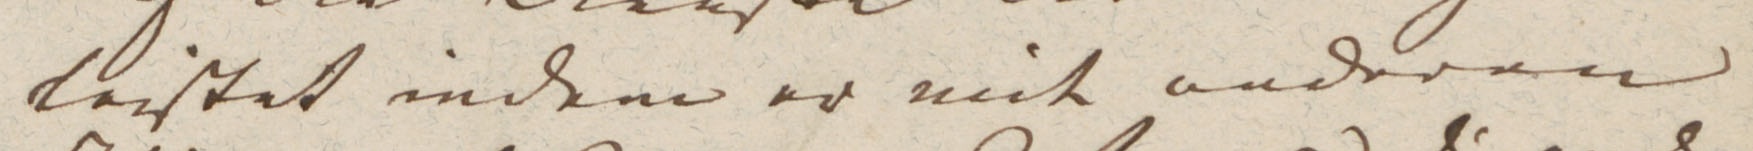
leistet indem er mit anderen
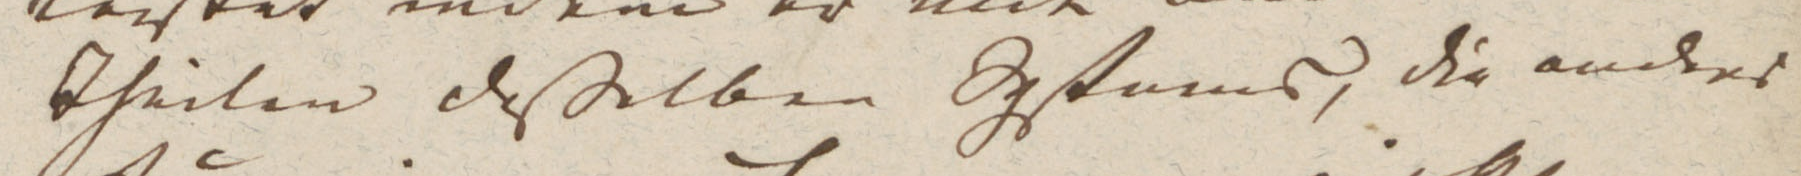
Theilen desselben Systems, die anders
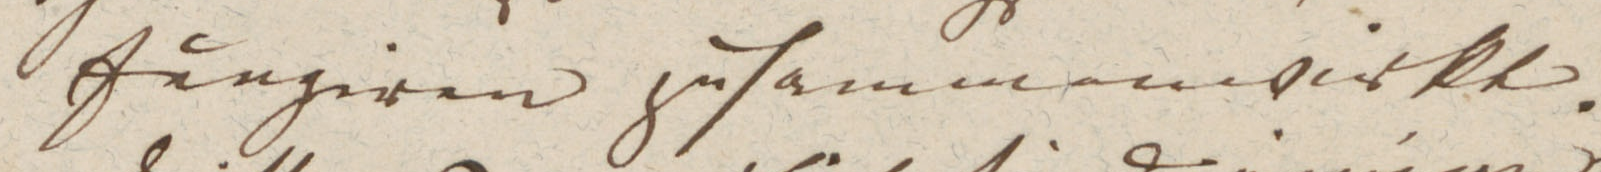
fungiren zusammenwirkt.
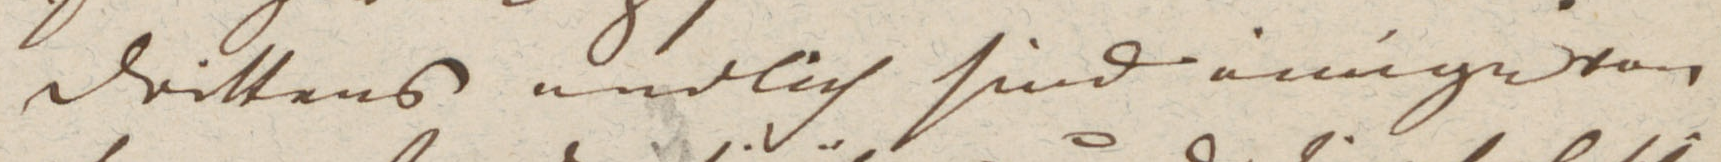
Drittens endlich sind einige von
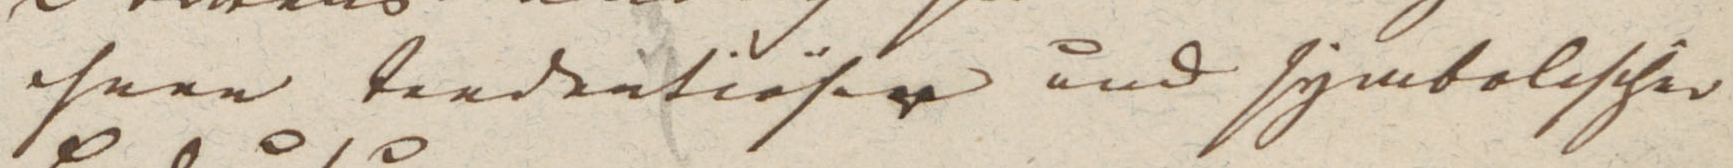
ihnen tendentziösenr und symbolischer
